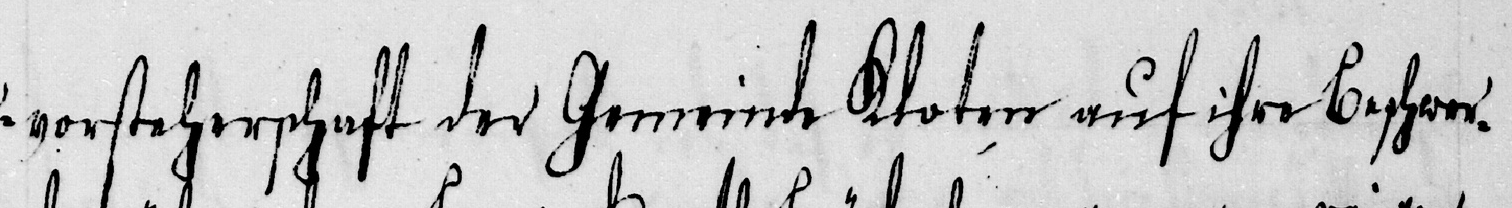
vorsteherschaft der Gemeinde Kloten auf ihre Beschwe¬
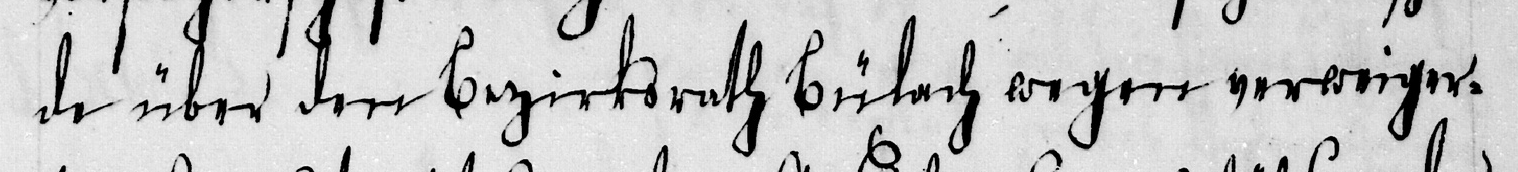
rde über den Bezirksrath Bülach wegen verweiger¬
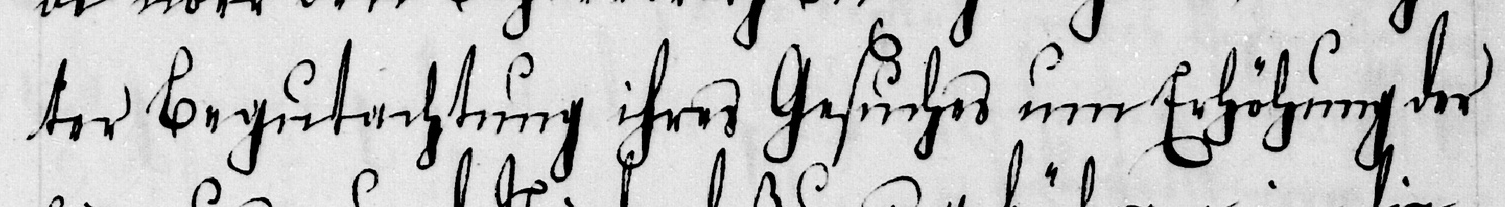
ter Begutachtung ihres Gesuches um Erhöhung der
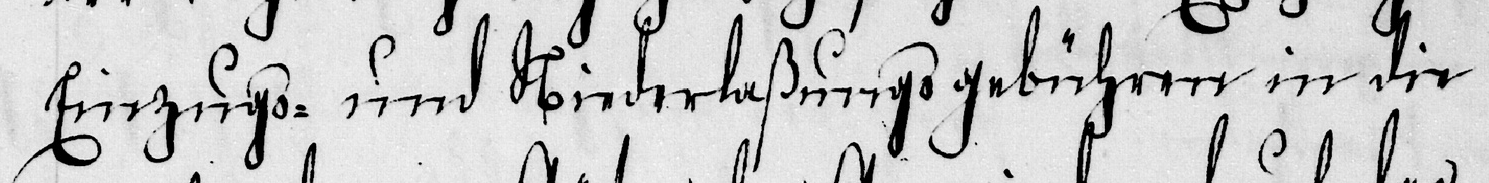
Einzugs- und Niederlaßungsgebühren in die
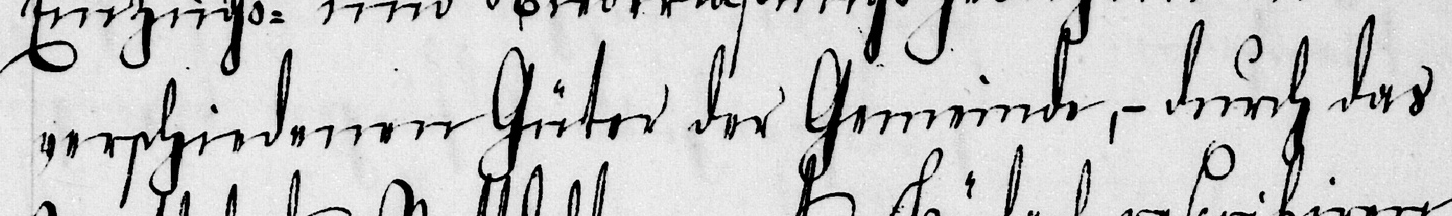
verschiedenen Güter der Gemeinde,– durch das
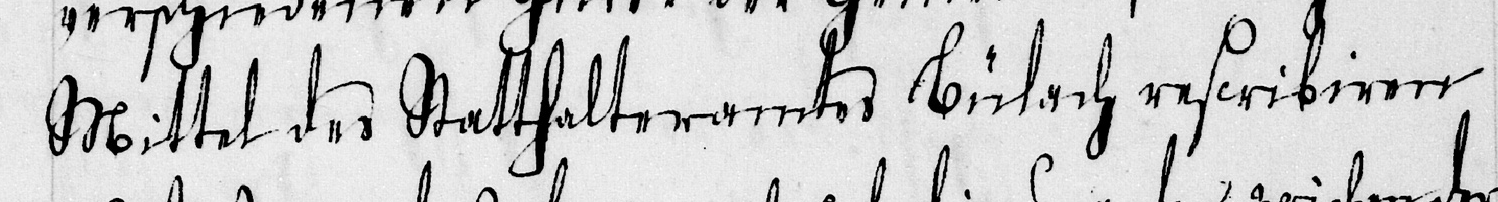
Mittel des Statthalteramtes Bülach rescribiren
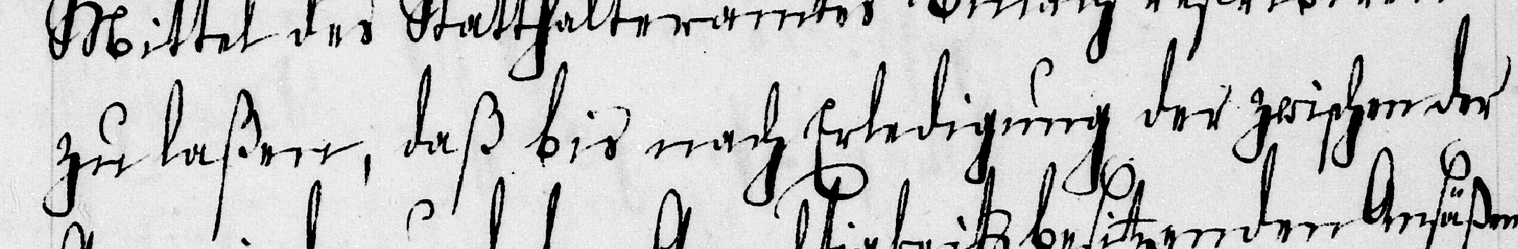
zu laßen, daß bis nach Erledigung der zwischen der
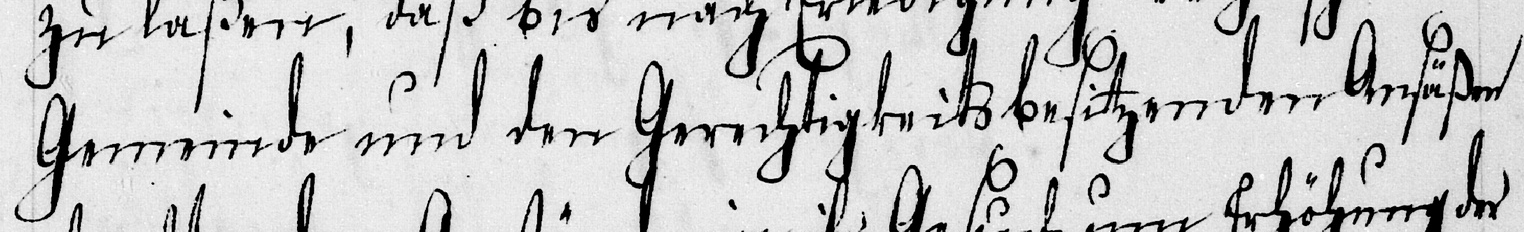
Gemeinde und den Gerechtigkeitsbesitzenden Ansäßen
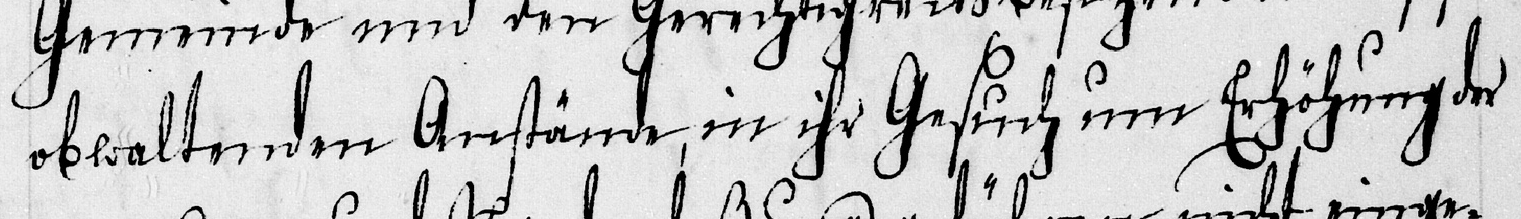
obwaltenden Anstände, in ihr Gesuch um Erhöhung der
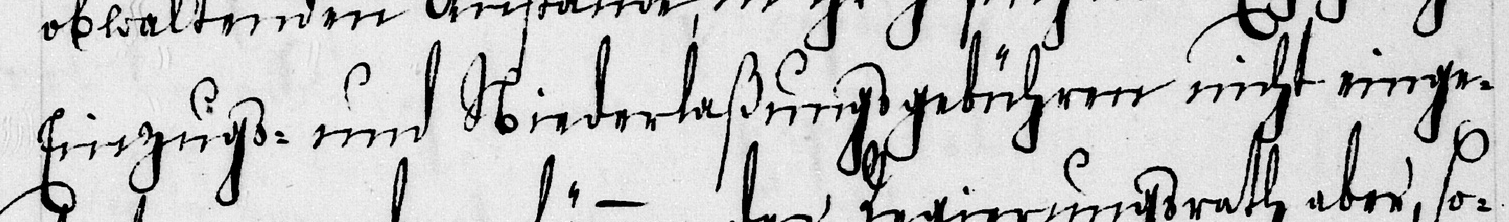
Einzugs- und Niederlaßungsgebühren nicht einge¬
